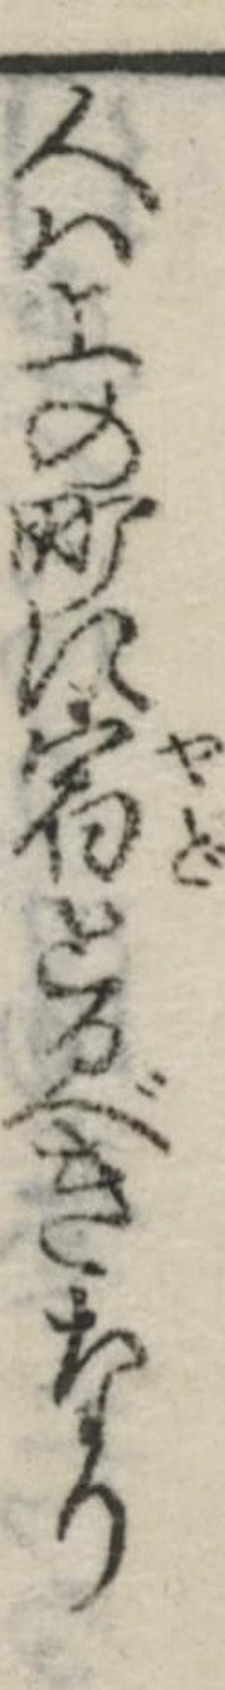人は上の町に宿とるべきなり
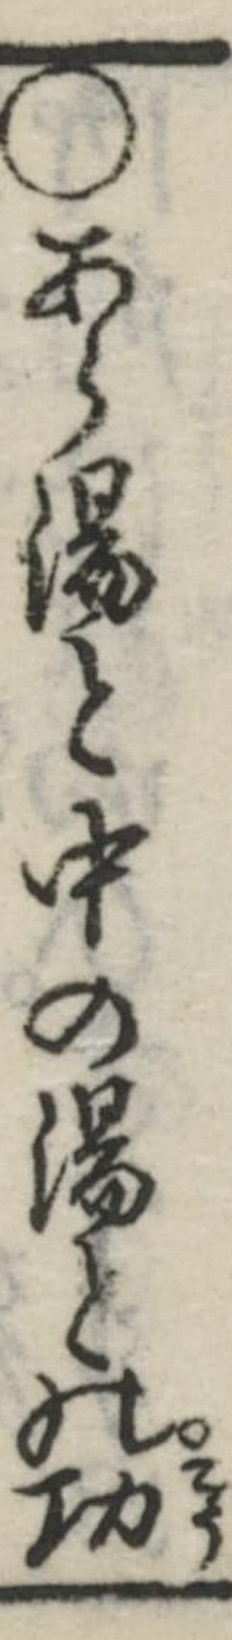◯あら湯と中の湯との。功
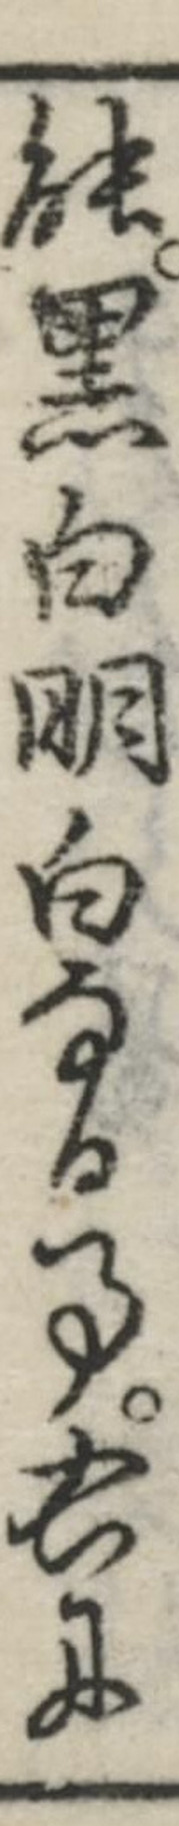能。黒白明白なる事。右に
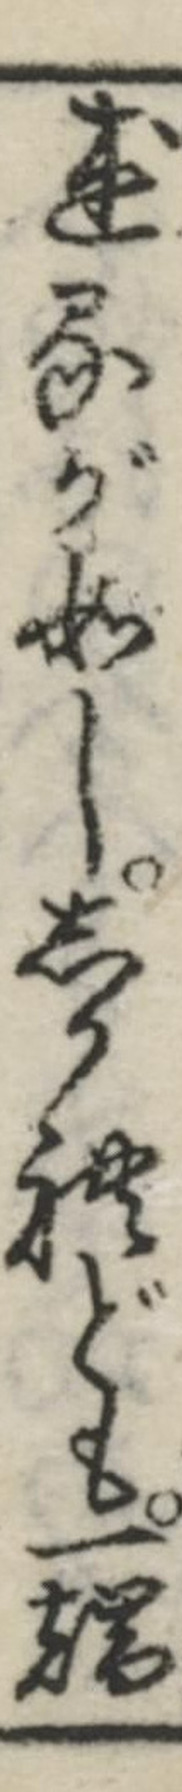述るが如し。しかれども。一端
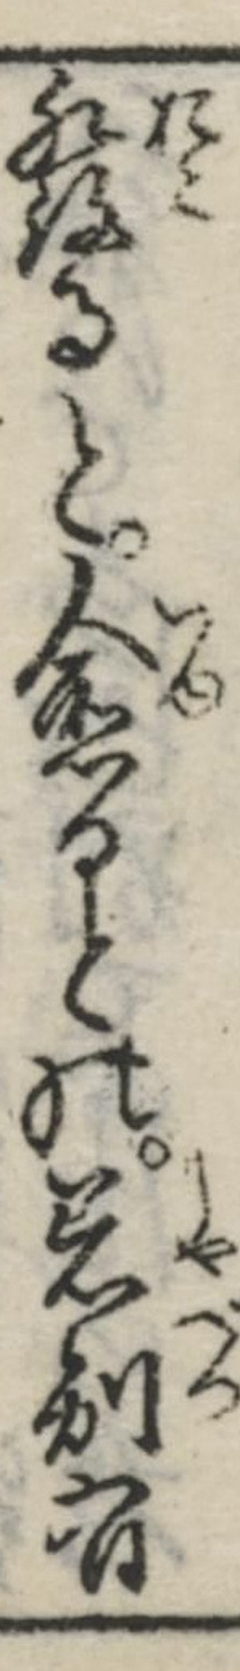発ると。愈るとの。差別有
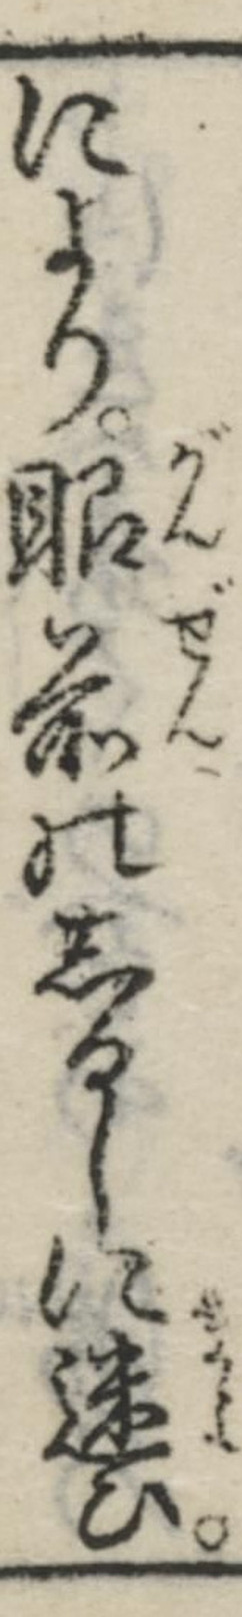により。眼前のしるしに迷ひ。
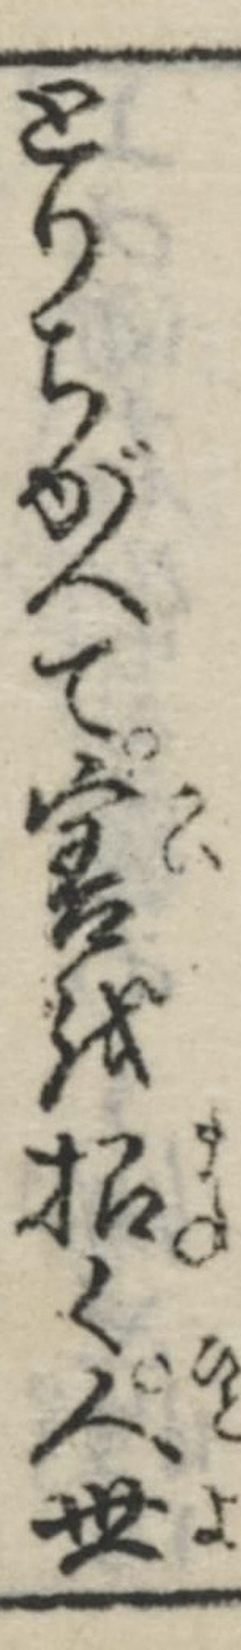とりちがへて。害を招く。人世
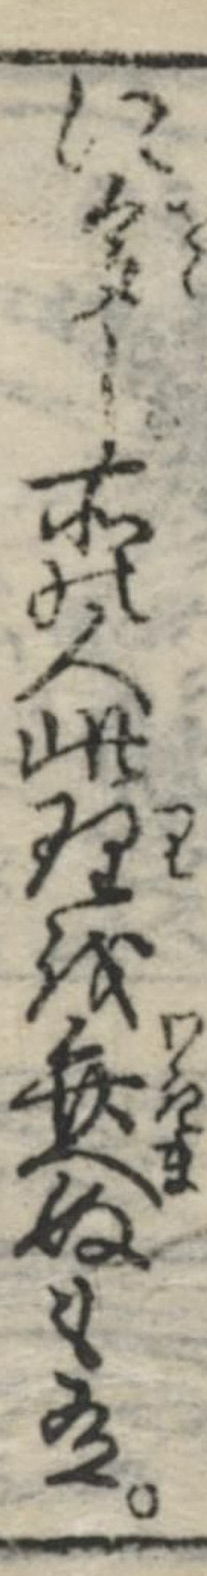に多し。所の人此理を弁へぬも有。
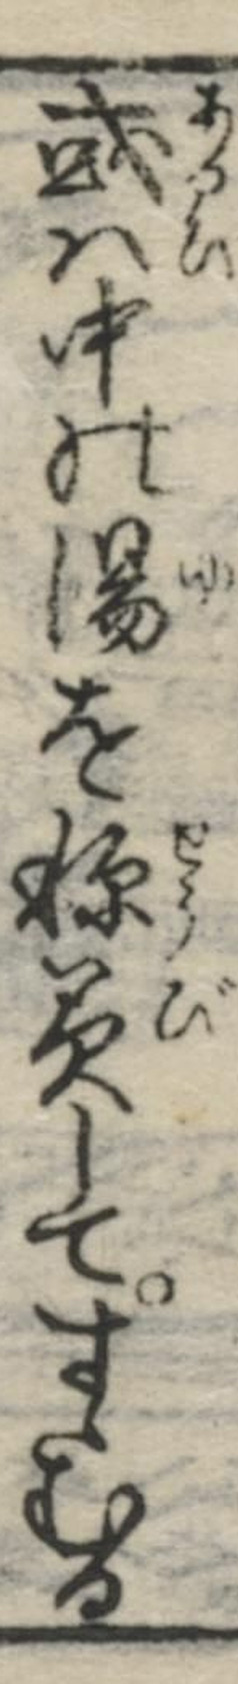或は中の湯を称美して。すゝむる
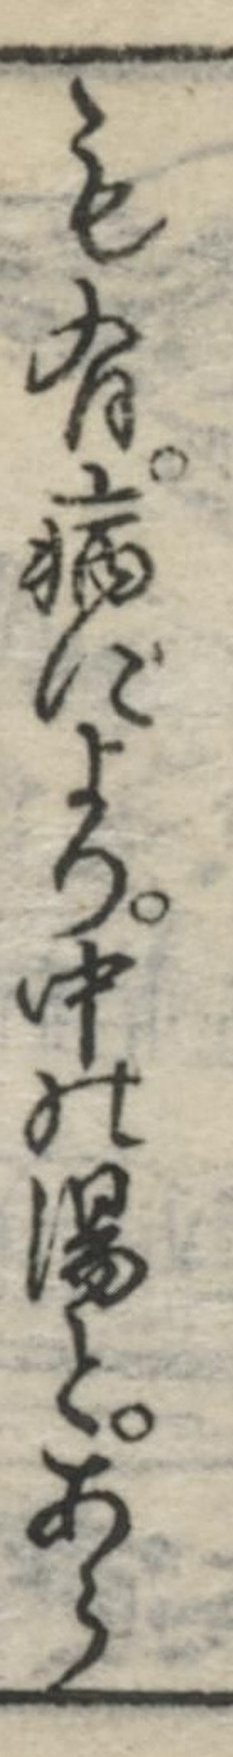も有。病により。中の湯と。あら
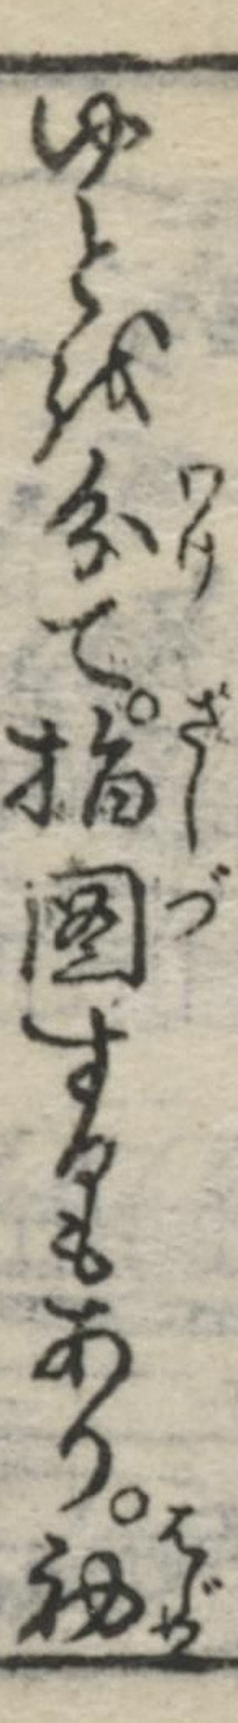ゆとを分て。指図するもあり。初
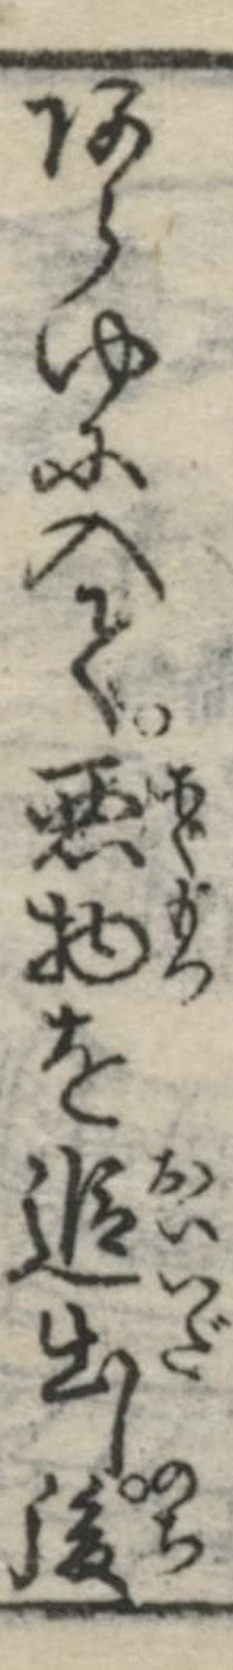あらゆに入て。悪物を追出し。後
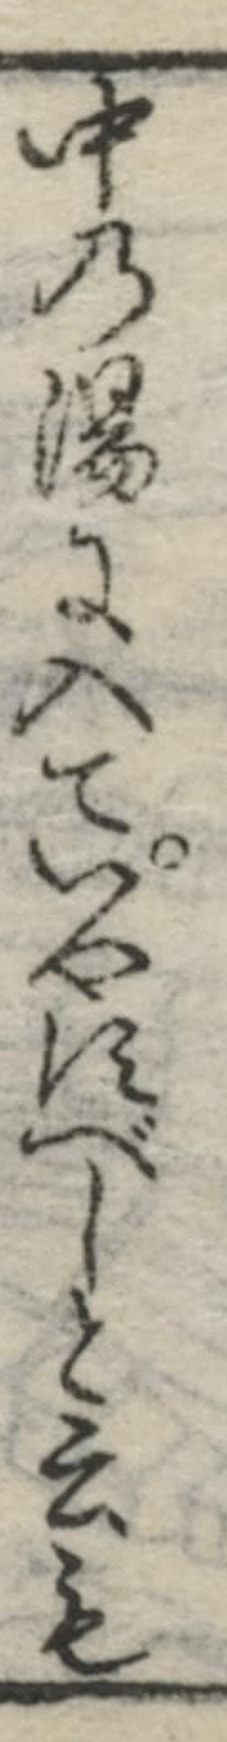中の湯に入て。いやすべしと云も
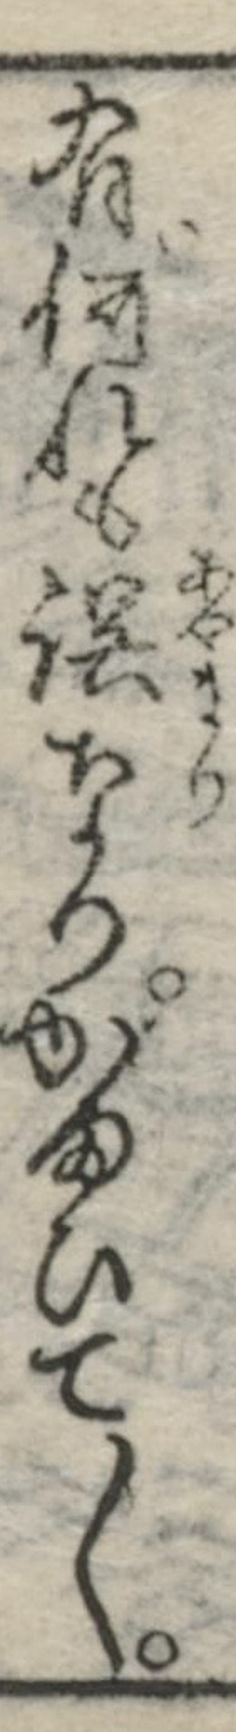有。何れも誤なり。かまひて〳〵。
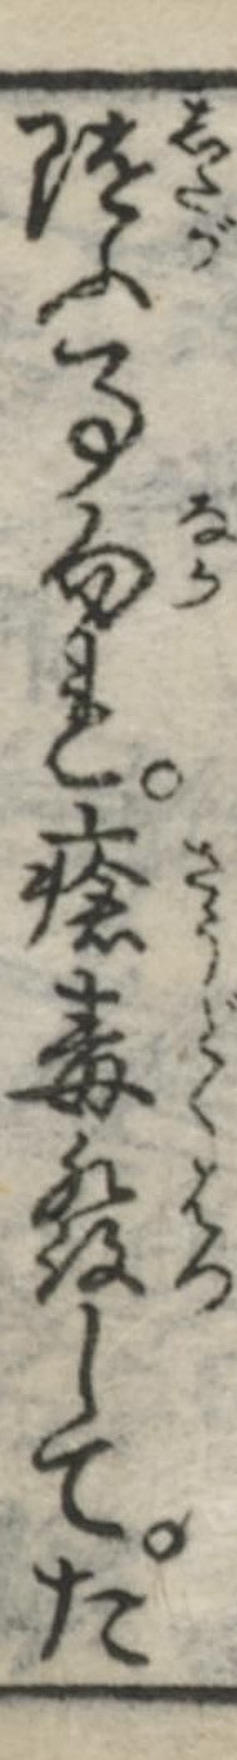随ふ事勿れ。瘡毒発して。た
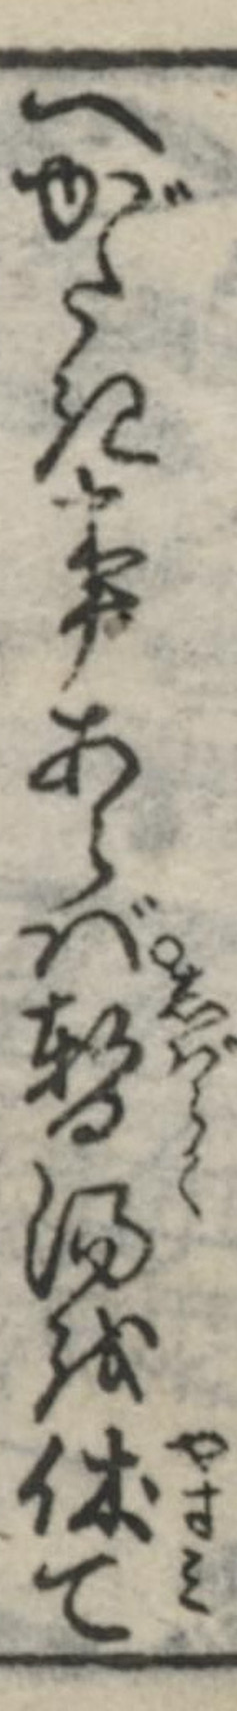へがたき事あらば。暫湯を休て
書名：但州城崎浴湯辧
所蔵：東京大学地震研究所図書室 Earthquake Research Institute Library, The University of Tokyo, JAPAN
